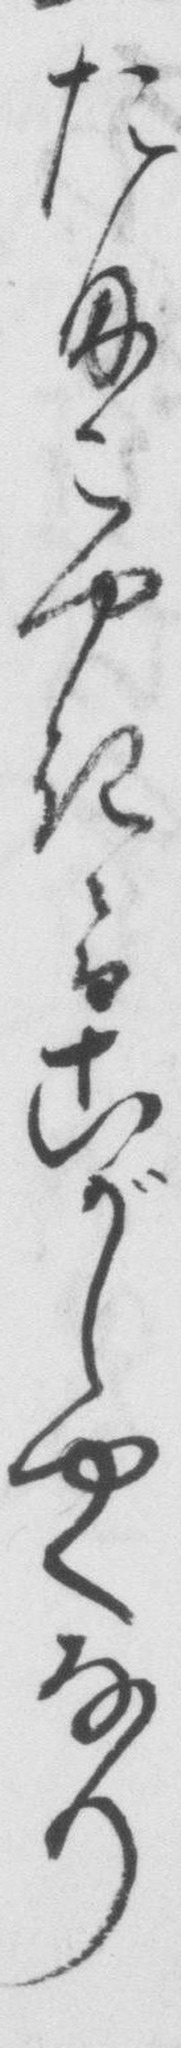たまこやきごがしやくなり
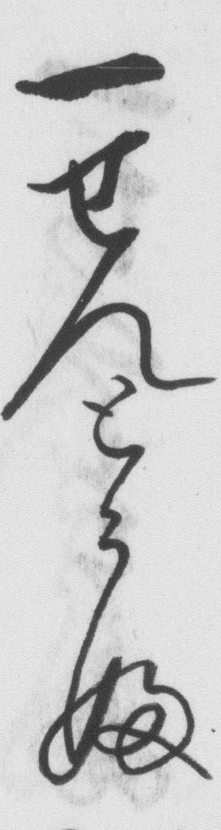一へにとうふ
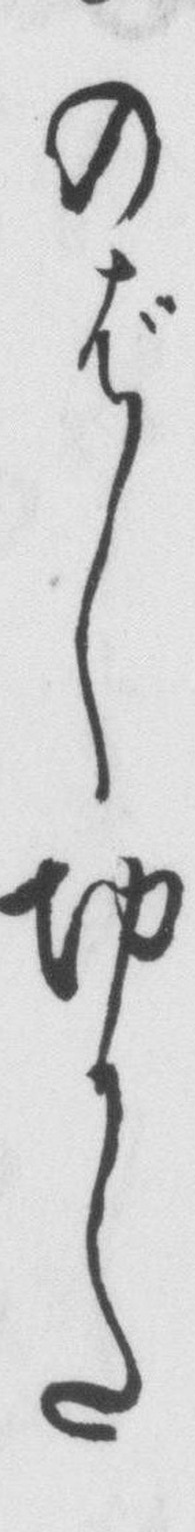のばして切かた
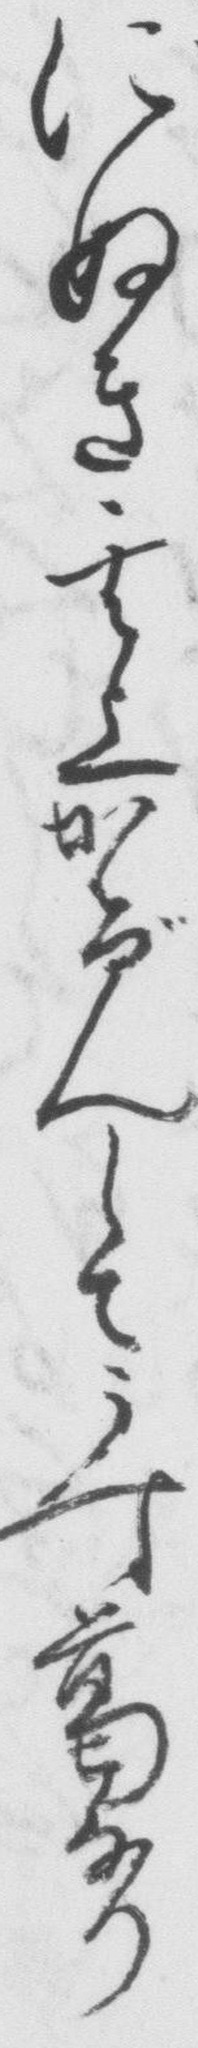にぬき其上かげんしてうす葛なり
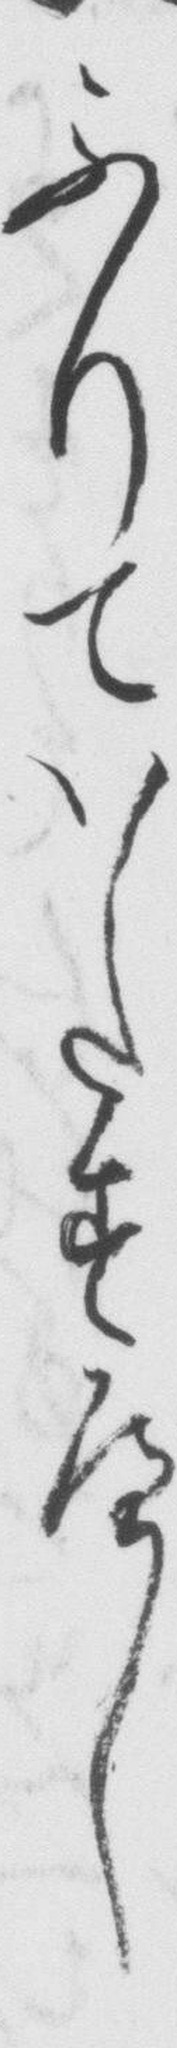ふりていたすべし
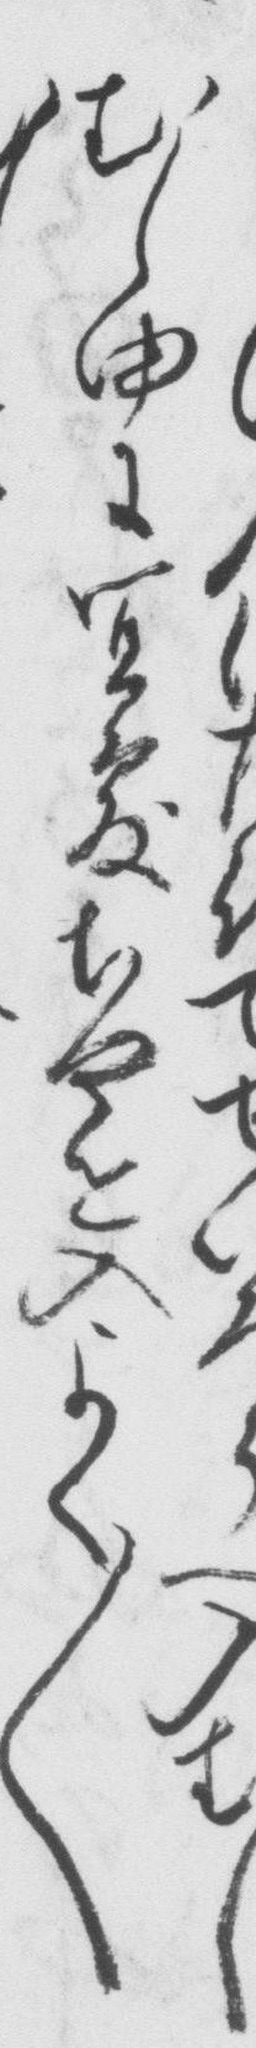むしゆに敷ちやを入れよく〳〵
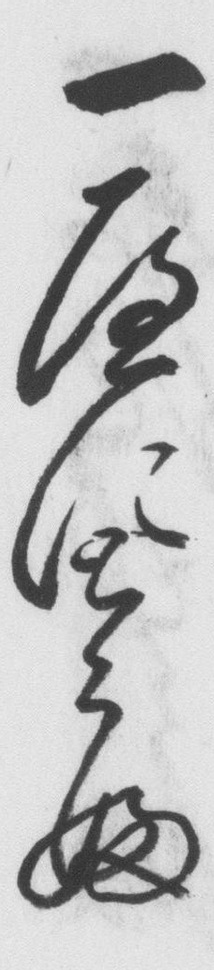一へにとうふ
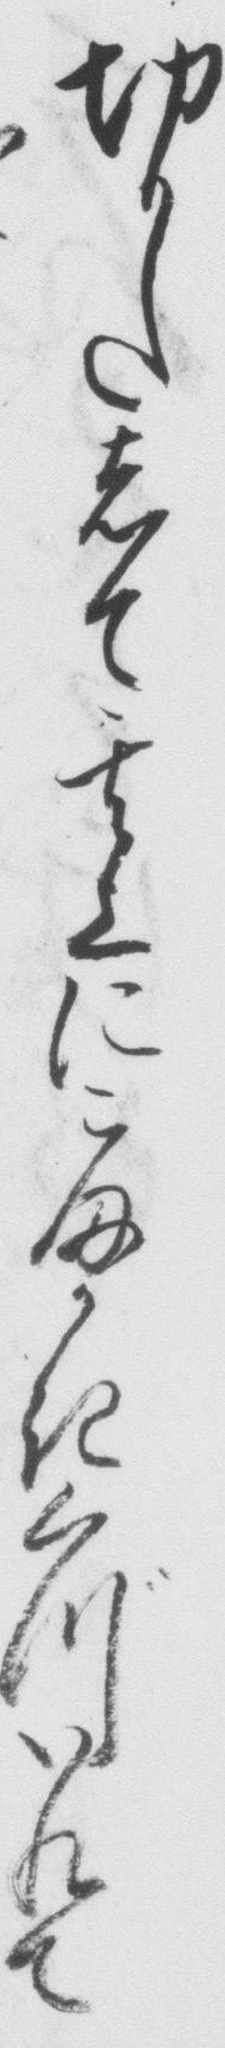一いとうふ切かたして其上にかきくついれて
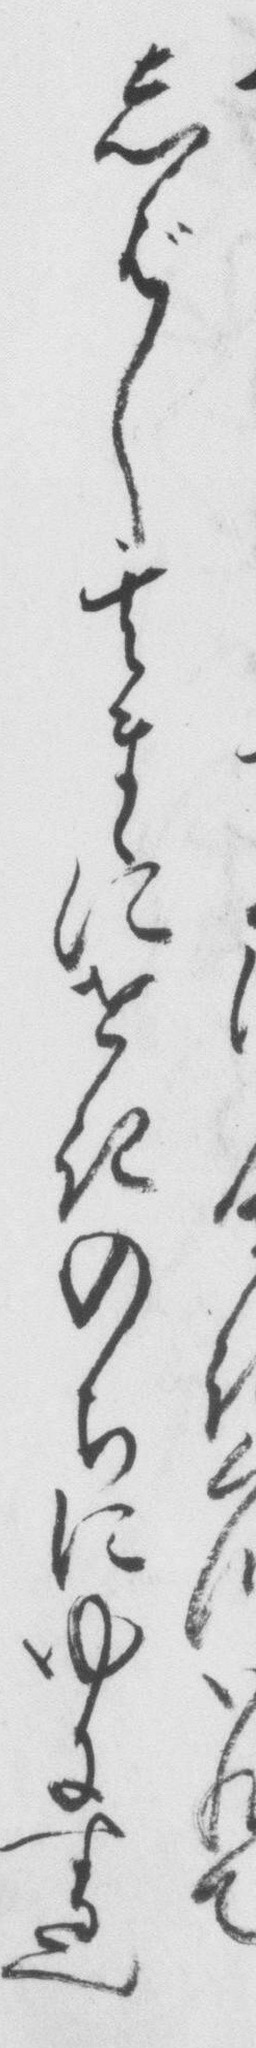しばし其まにをきのちにゆるす也
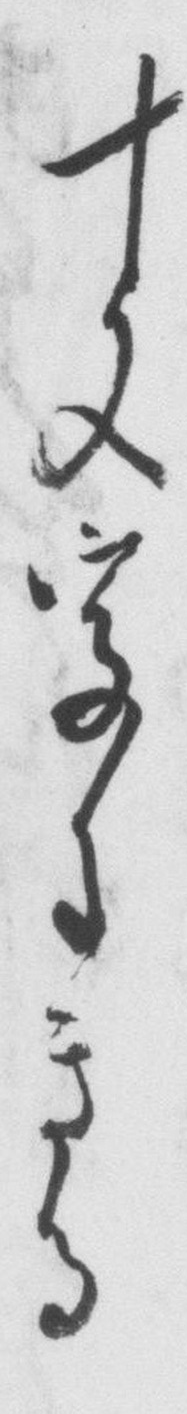十文字にきる

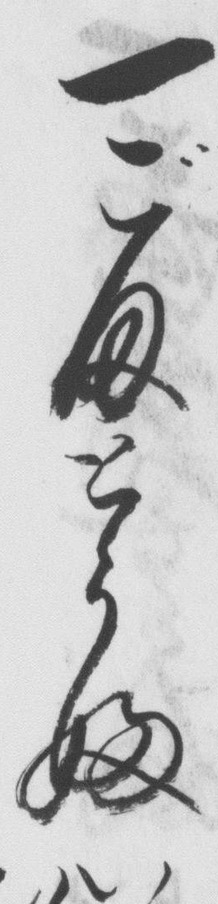一しきとうふ
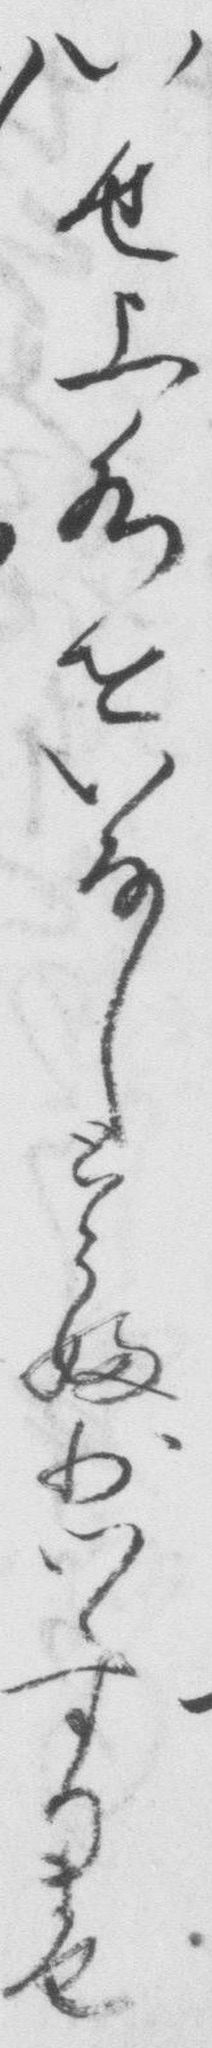いせ上水をいしとうふに少ツすりませ
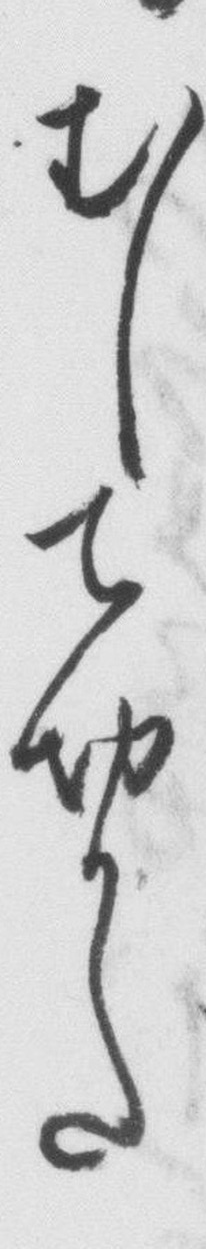むして切かた
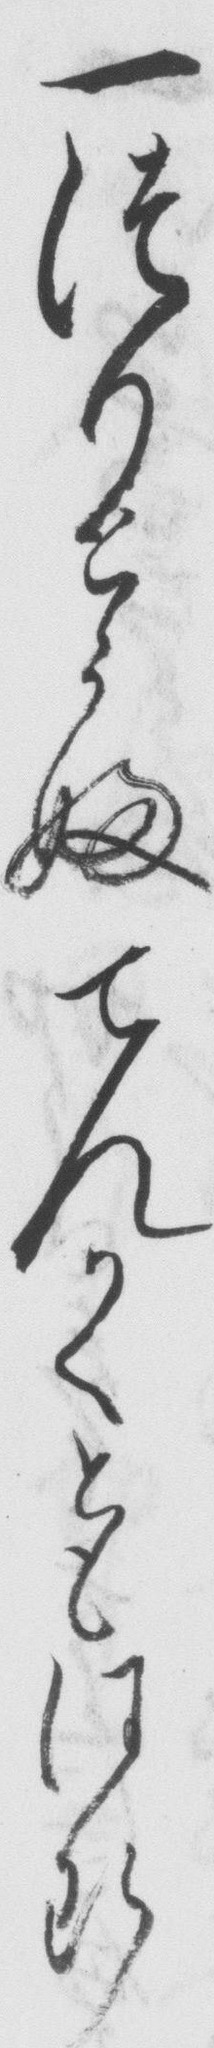一つりとうふてんかくとも同段
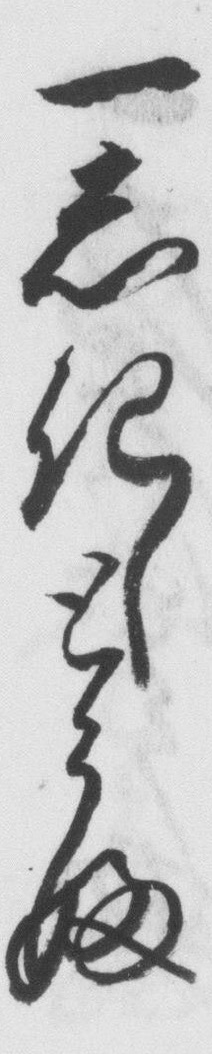一しきとうふ
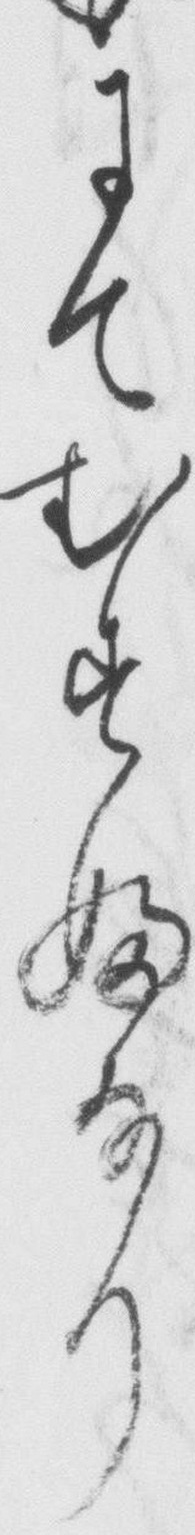にてむすぶなり
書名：料理筌
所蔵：大阪府立大学学術情報センター 国文学研究資料館
